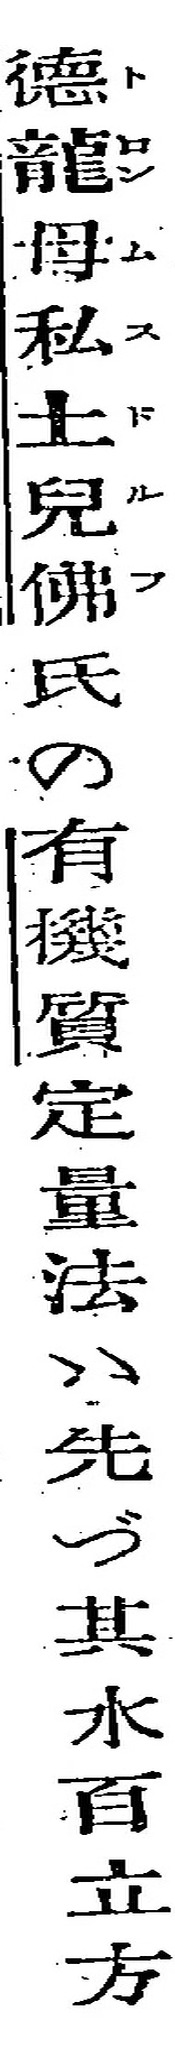德龍母私土兒佛氏の有機質定量法は先づ其水百立方
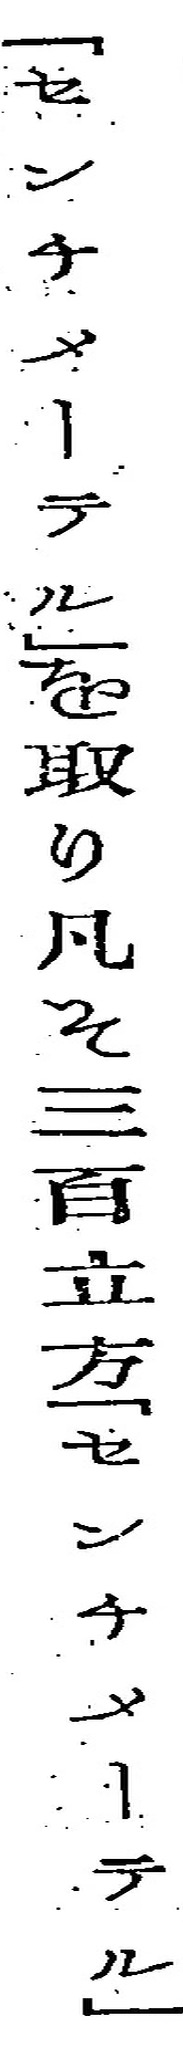[センチメーテル]を取り凡そ三百立方[センチメーテル]
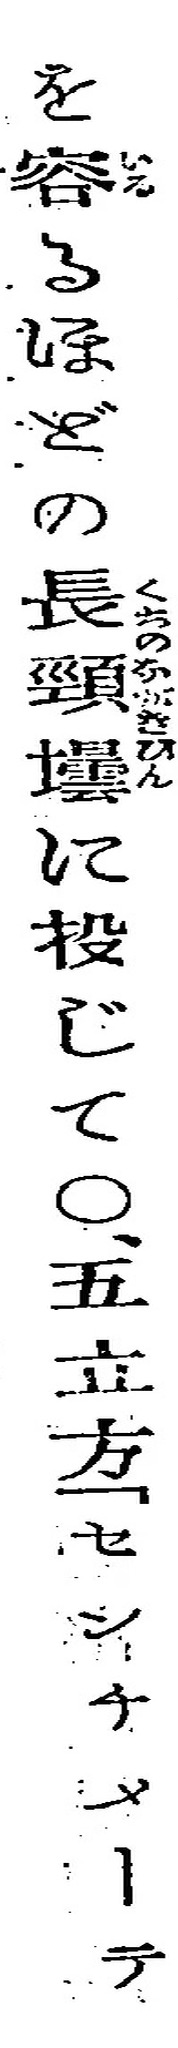を容るほどの長頸壜に投じて〇、五立方[センチメーテ

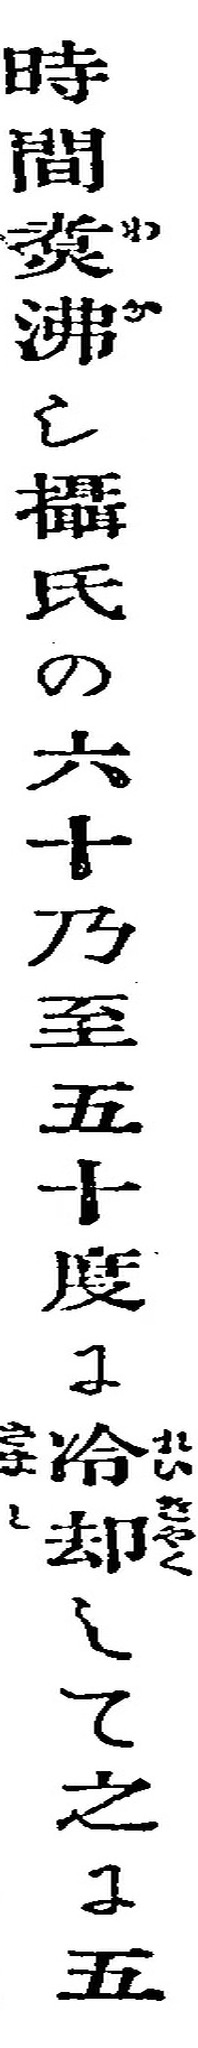時間煑沸し摂氏の六十乃至五十度に冷却して之に五
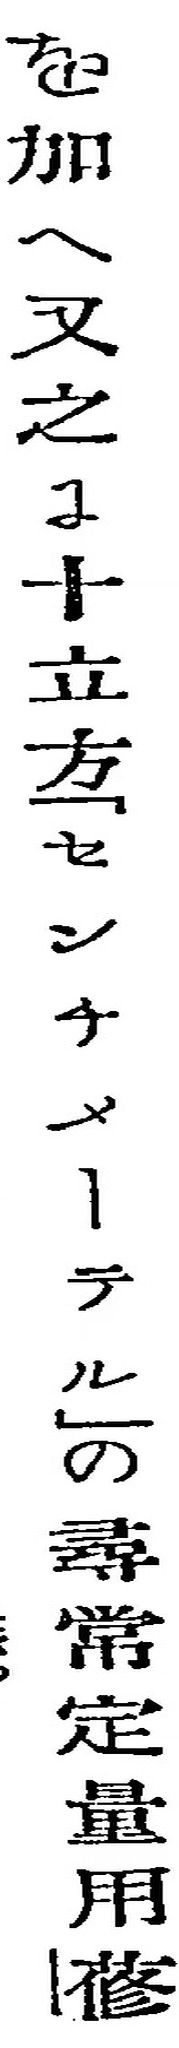を加へ又之に十立方[センチメーテル]の尋常定量用蓚
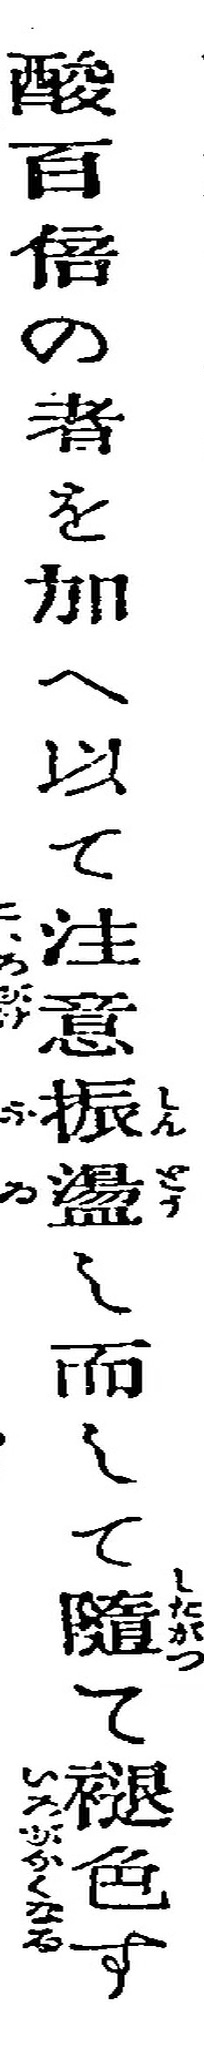酸百倍の者を加へ以て注意振盪し而して随て褪色す
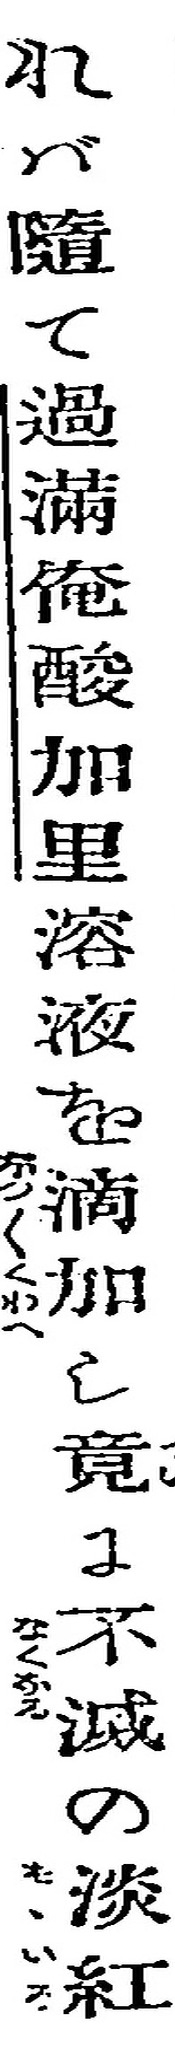れば随て過滿俺酸加里溶液を滴加し竟に不滅の淡紅
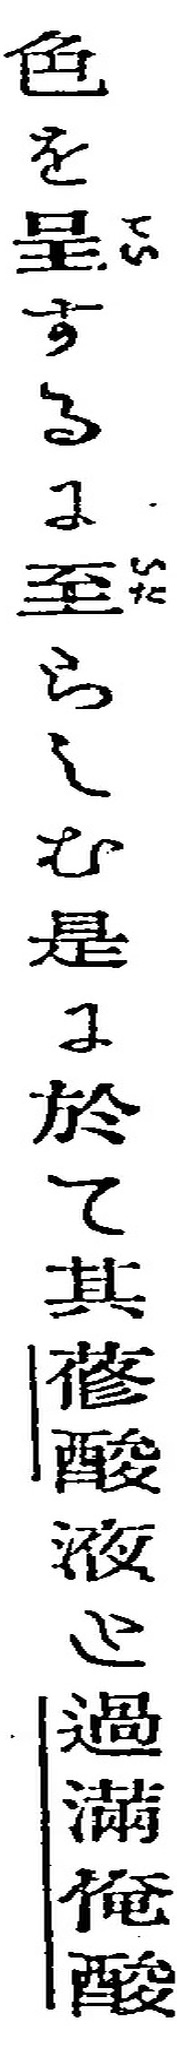色を呈するに至らしむ是に於て其蓚酸液と過滿俺
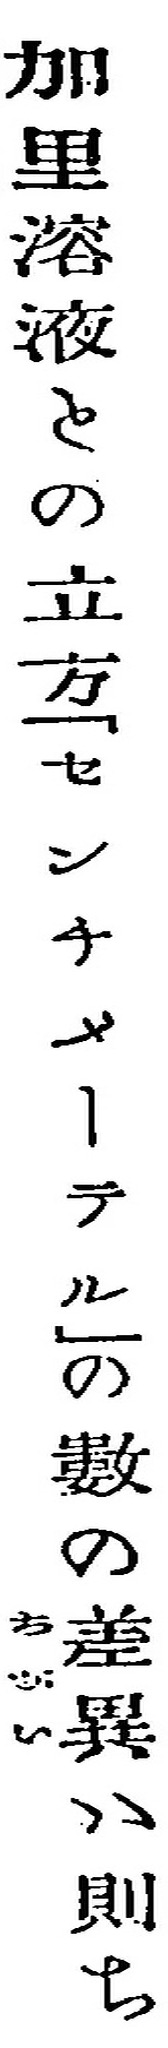酸加里溶液との立方[センチメーテル]の数の差異は則ち
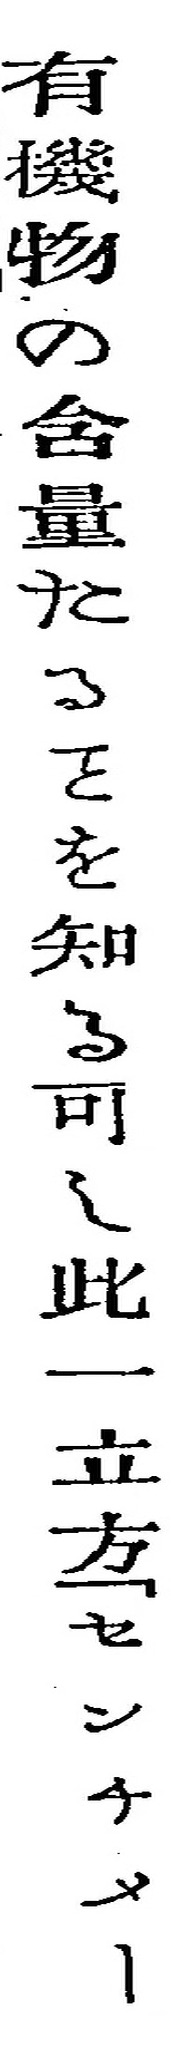有機物の含有たることを知る可し此一立方[センチメー
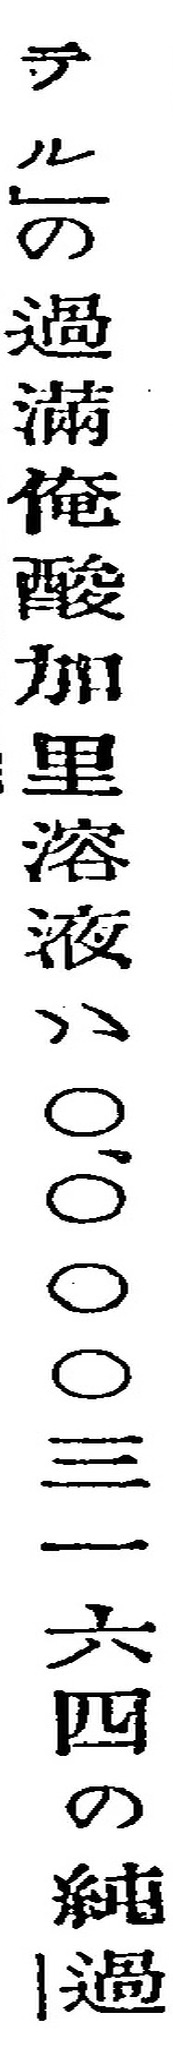テル]の過滿俺酸加里溶液は〇、〇〇〇三一六四の純過
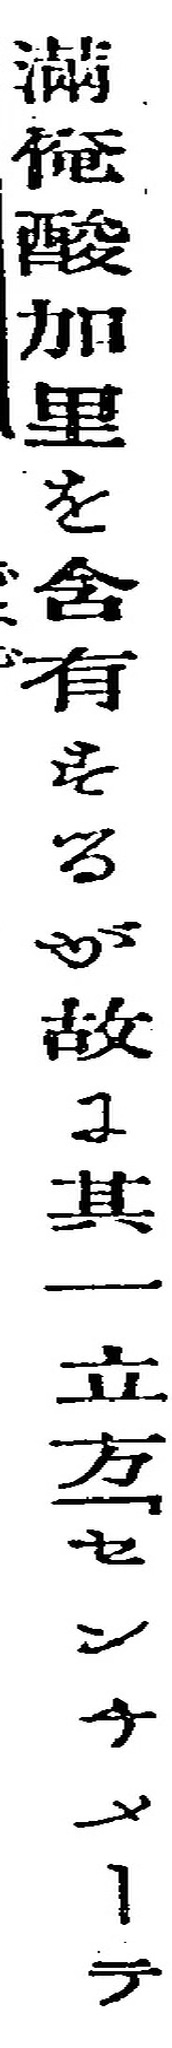滿俺酸加里を含有するが故に其一立方[センチメーテ
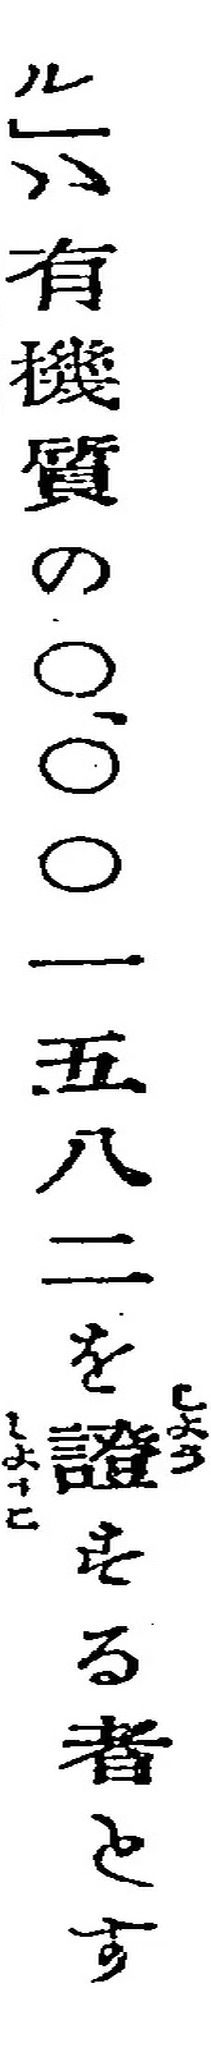ル]は有機質の〇、〇〇一五八二を證する者とす
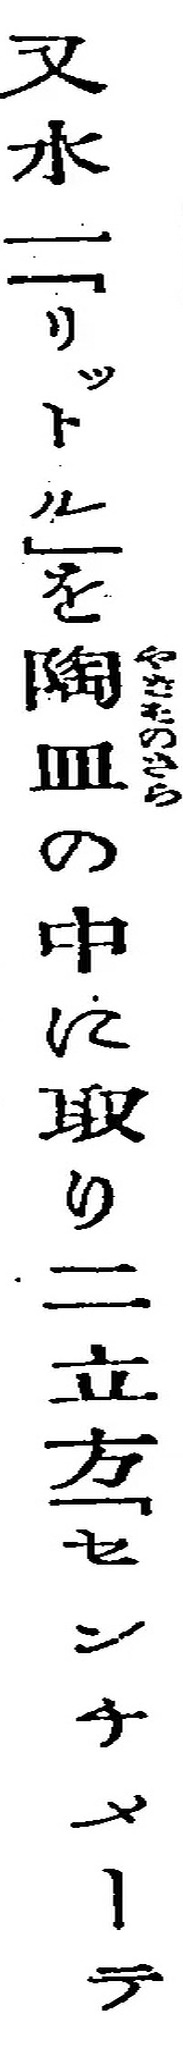又水一[リットル]を陶皿の中に取り二立方[センチメーテ
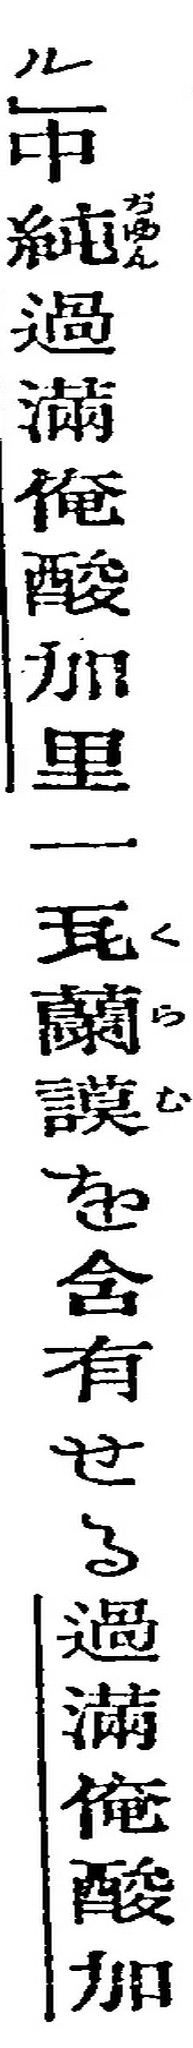ル]中純過滿俺酸加里一瓦蘭膜を含有せる過滿俺酸加
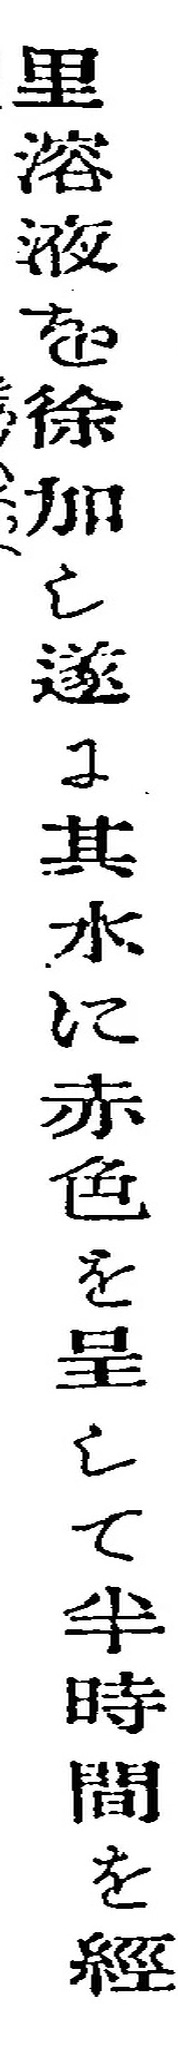里溶液を徐加し遂に其水に赤色を呈して半時間を経
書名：飲水の心得 : 伝染病の予防
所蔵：国立国会図書館 National Diet Library, JAPAN
